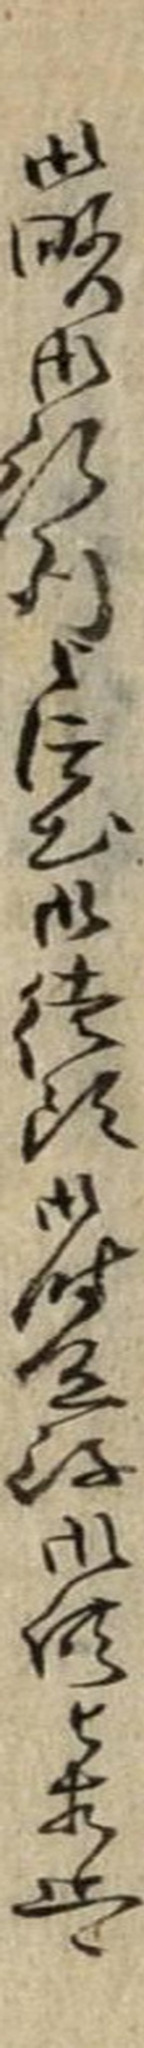御略御行列被仰出御徒頭御時宜役御供被相止候
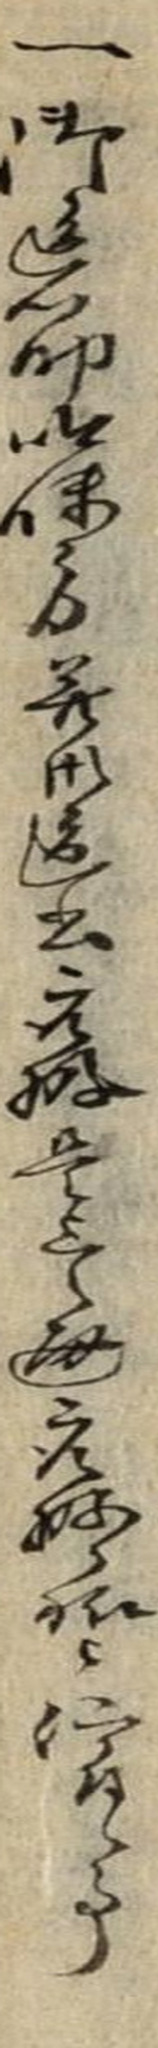一御道筋吟味方并御道書取扱是迄之通取扱候様被仰付候事
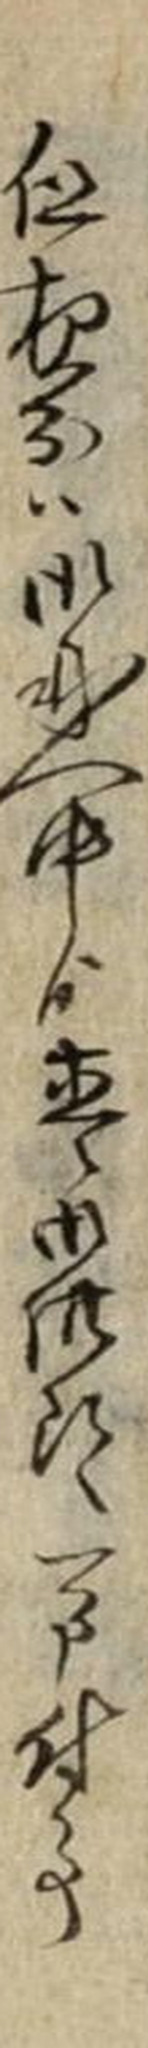但夜分は御用人中ゟ直々御供頭へ可申付事
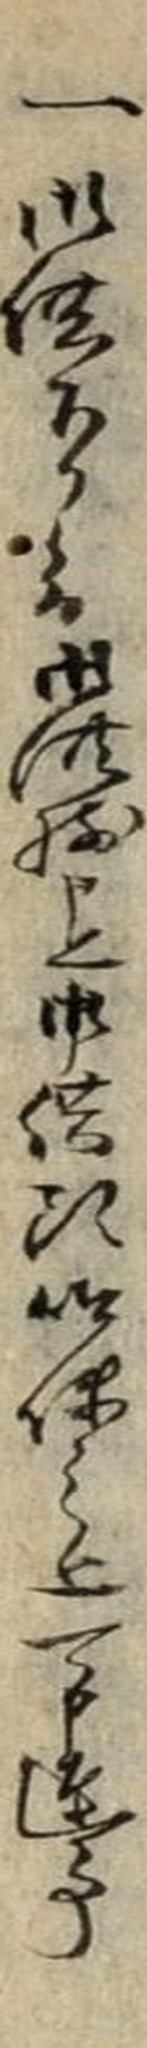一御供下り候に付御供揃申上御供頭吟味之上可申達候事
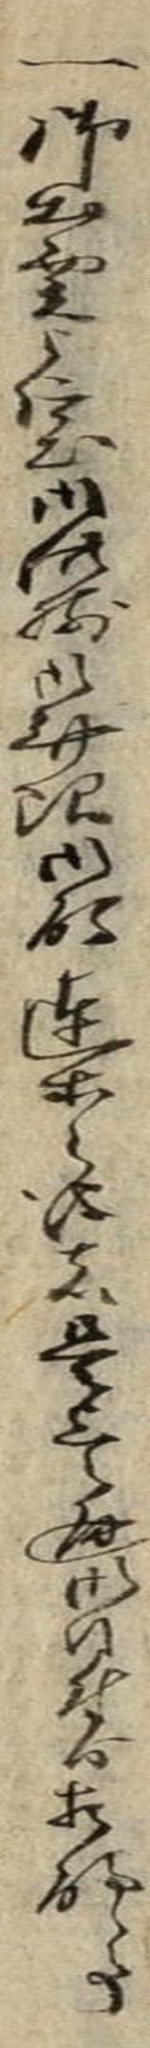一御出殿被仰出御供揃御刻限御触達等之儀は是迄之通御目付ゟ相触候事
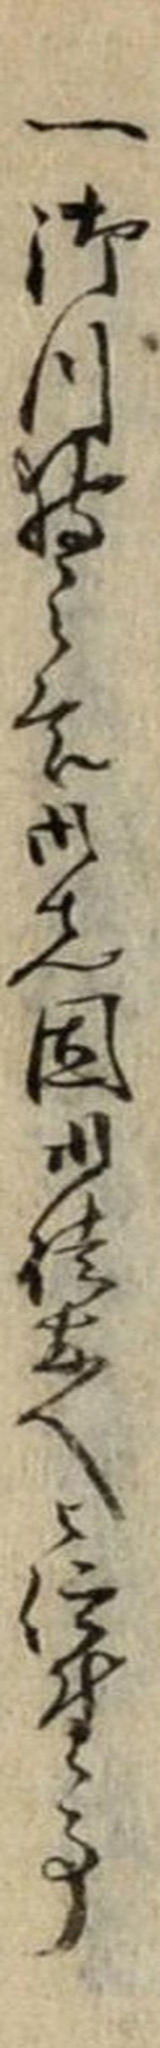一御川狩之節御先固御徒両人被仰付候事
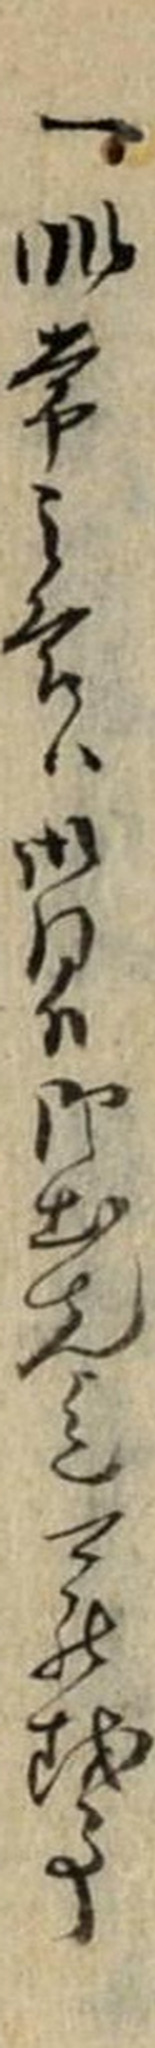一非常之節は御目付御出先迄可罷越事
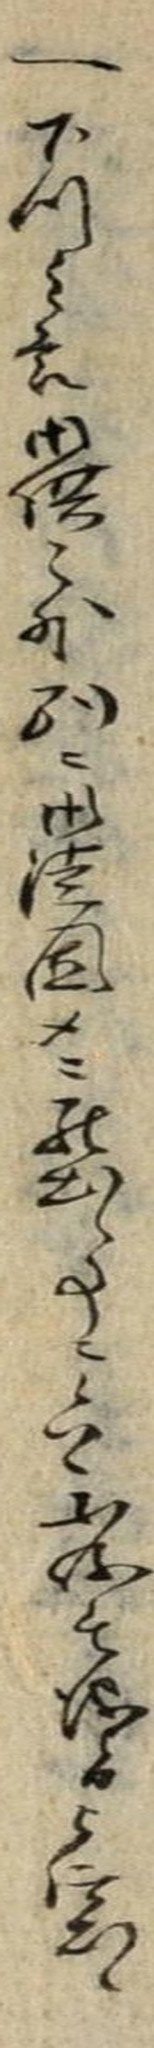一下川之節御供之外別に御徒固メに罷出候事に候はゝ不及其儀旨被仰出候
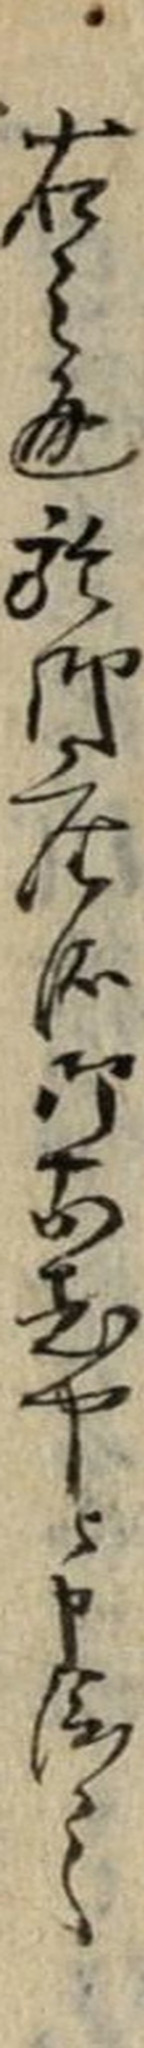右之通於御座所御家老中被申渡之
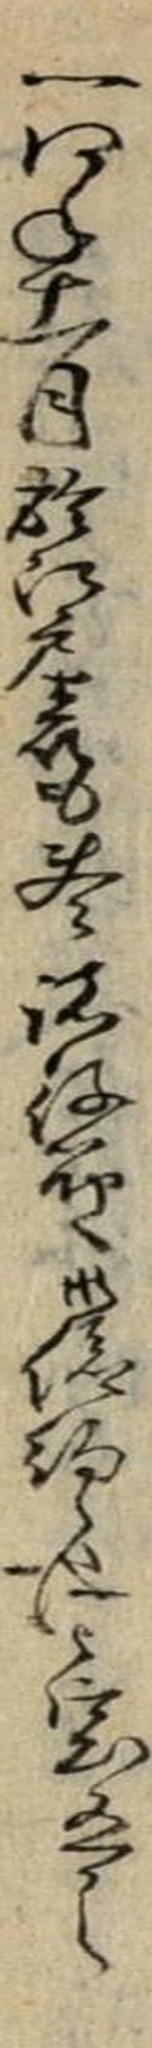一同年十一月於江戸表も夫々諸役筋へ御倹約之儀被仰出有之
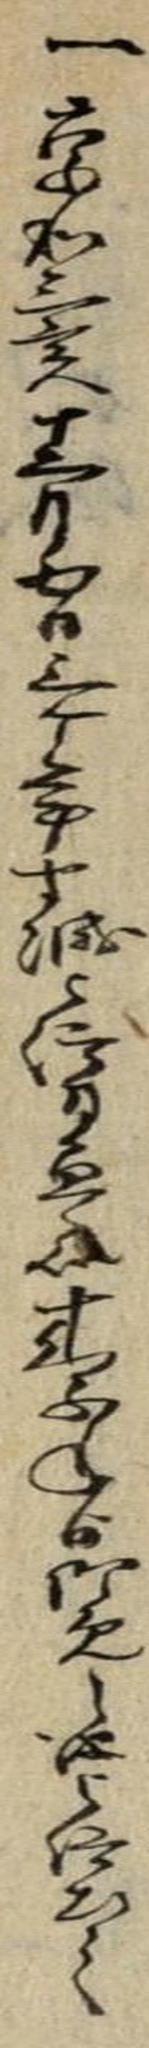一享和三亥十二月五日三ケ年半減被仰付置候処来子年ゟ御免之儀被仰出之
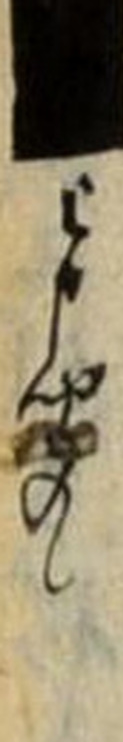被申聞候
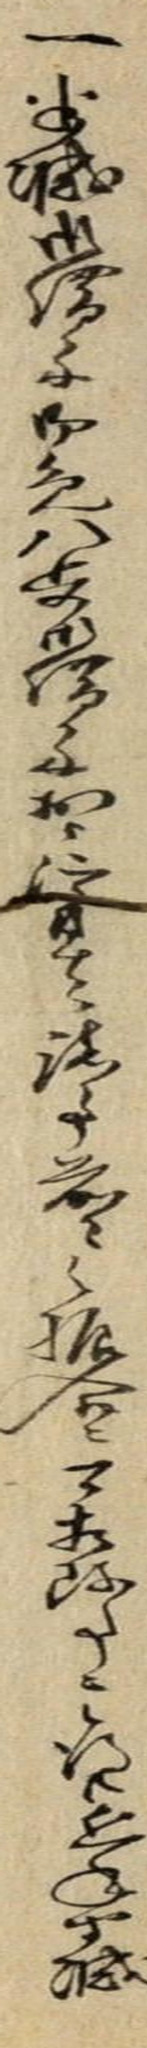一半減御借米御免八歩御借米於被仰付は諸事前々之振合に可相改候事に候得共近年半減
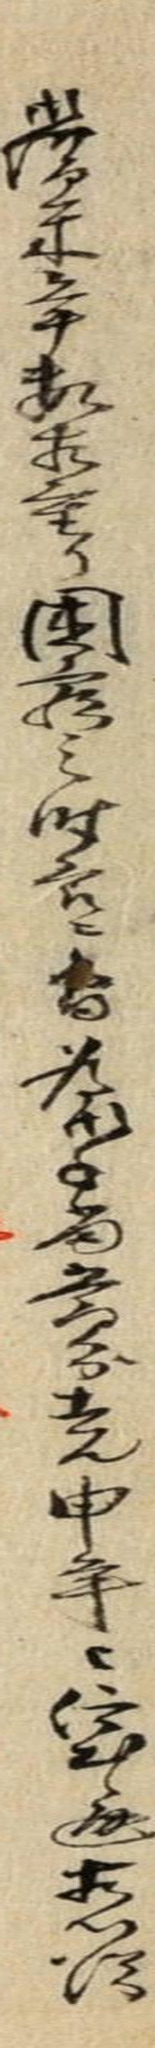御借米年数相重り困窮之時節に候間為御手当当分去ル申年被仰出候通相心得
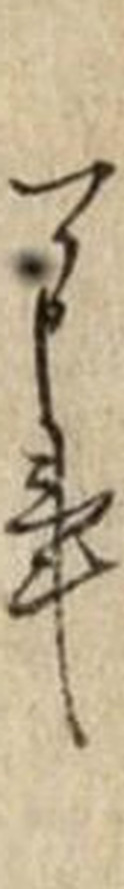可申事
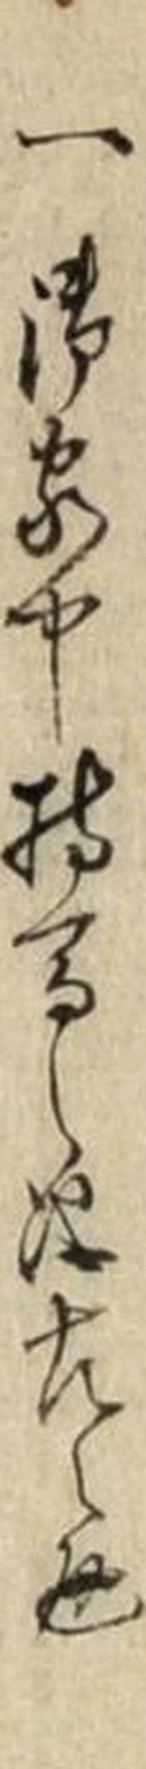一御家中持馬之儀左之通
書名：御用并被仰出之部
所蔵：福井県文書館 Fukui Prefectural Archives
